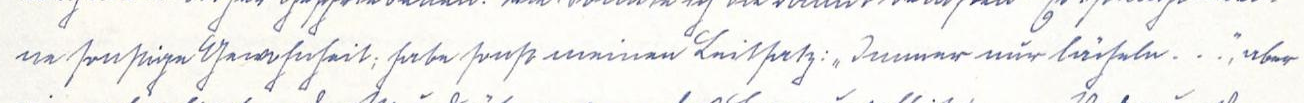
ne sonstige Gewohnheit; habe sonst meinen Leitsatz: „Immer nur lächeln..." aber
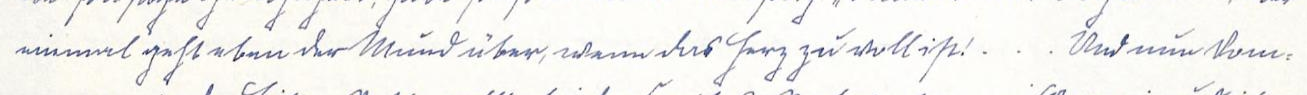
einmal geht eben der Mund über, wenn das Herz zu voll ist.Und nun kom-
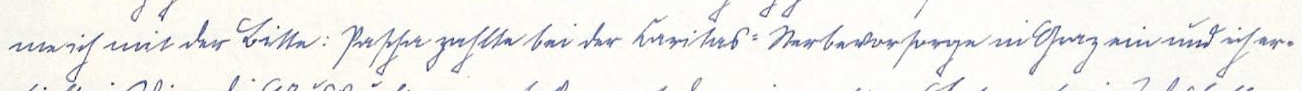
me ich mit der Bitte: Pascha zählte bei der Caritas: Sterbevorsorge in Graz ein und ich er-
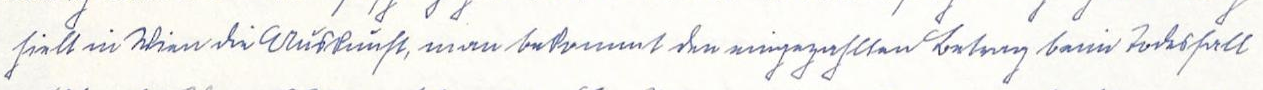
hielt in Wien die Auskunft, man bekommt den eingezahlten Beitrag beim Todesfall
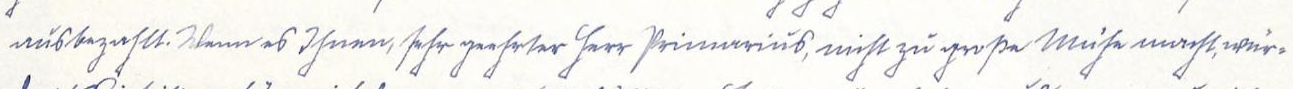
ausbezahlt. Wenn es Ihnen sehr geehrter Herr Primarius, nicht zu große Mühe macht, wür-
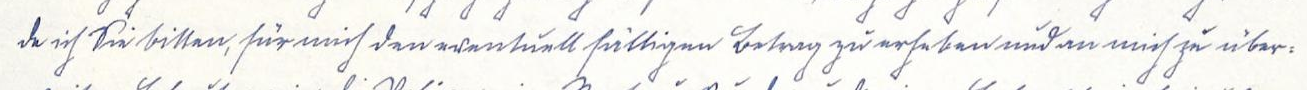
de ich Sie bitten, für mich den eventuell fälligen Beitrag zu erheben und an mich zu über-
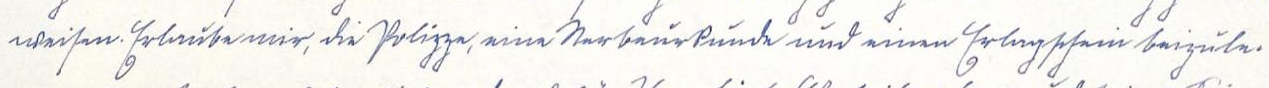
weisen. Erlaube mir, die Polizze, eine Sterbeurkunde und einen Erlagschein beizule-
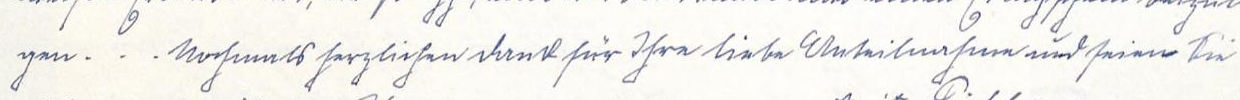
gen... Nochmals Herzlichen Dank für Ihre liebe Anteilnahme und seien Sie
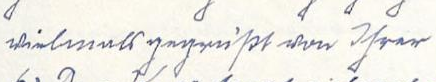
vielmals gegrüsst von Ihrer
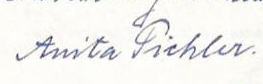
Anita Pichler.
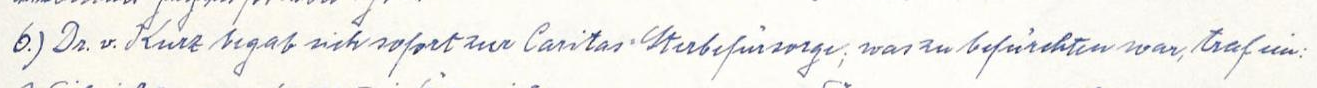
6.) Dr. v. Kurz begab sich sofort zur Caritas- Sterbefürsorge, was zu befürchten war, traf ein.
